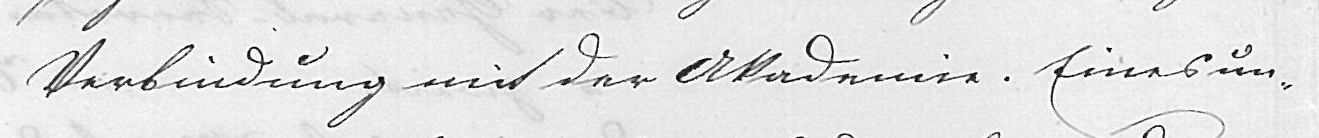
Verbindung mit der Akademie. Eines un-
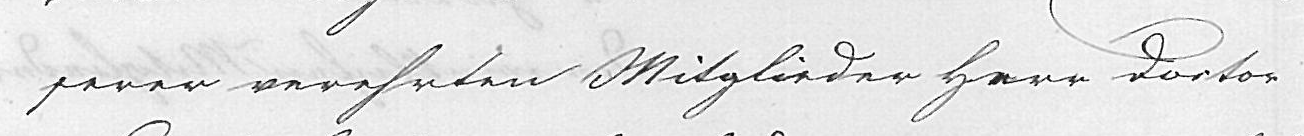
serer verehrten Mitglieder Herr Doctor
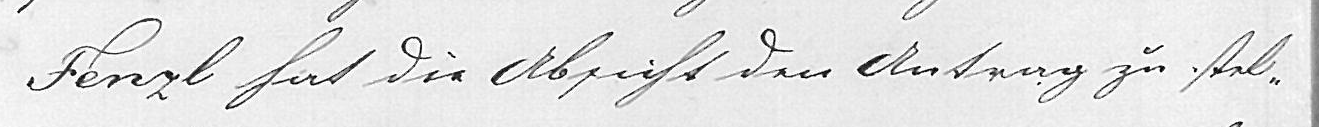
Fenzl hat die Absicht den Antrag zu stel-
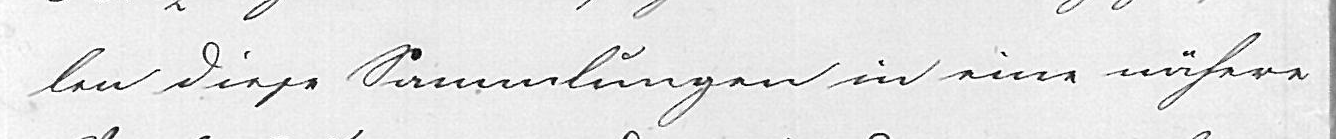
len diese Samclungen in eine nähere
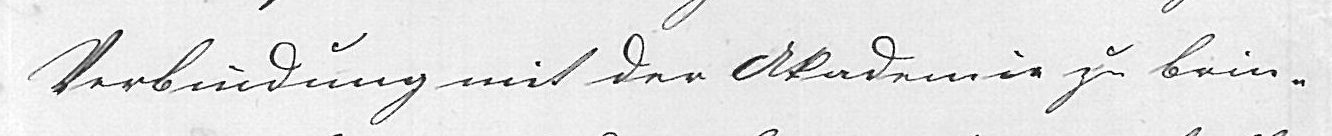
Verbindung mit der Akademie zu brin-
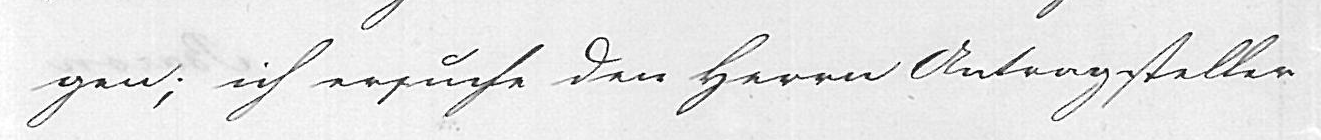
gen; ich ersuche den Herrn Antragsteller
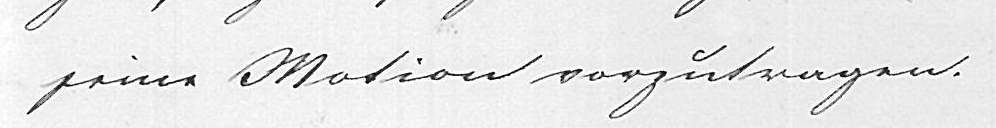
seine Motion vorzutragen.
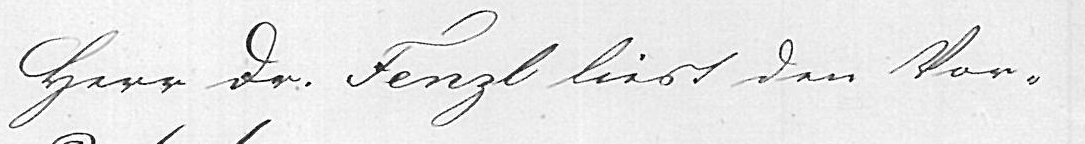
Herr Dr. Fenzl liest den Vor-
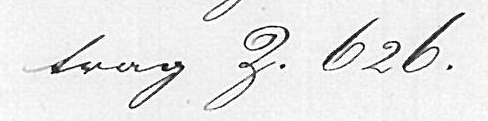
trag Z. 626.
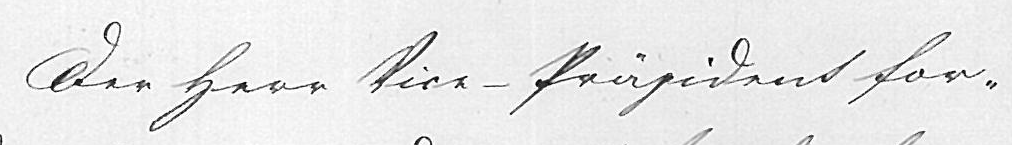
Der Herr Vice-Präsident for-
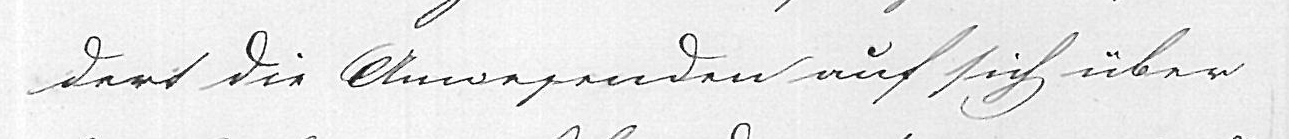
dert die Anwesenden auf sich über
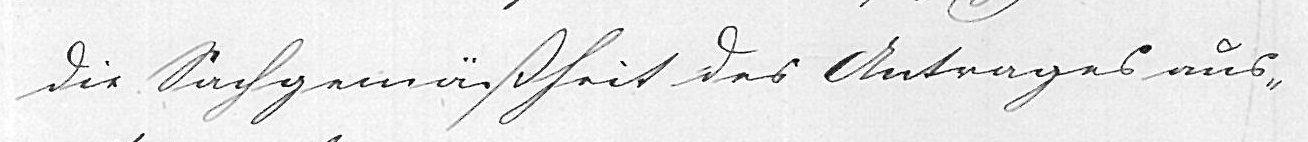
die Sachgemäßheit des Antrages aus-
